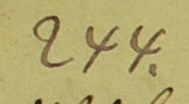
244
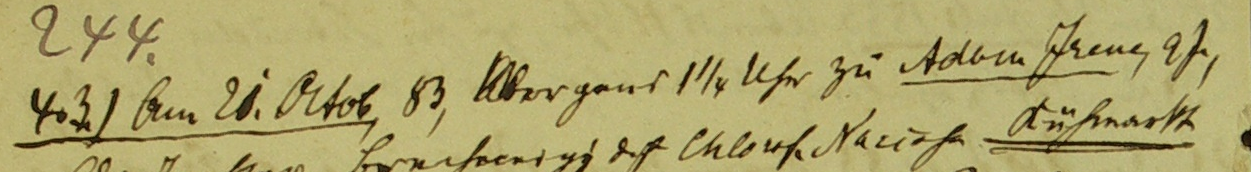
43. Am 21 Okt., 83, Morgens 1 ¼ Uhr zu Adam Irene, 9 J.
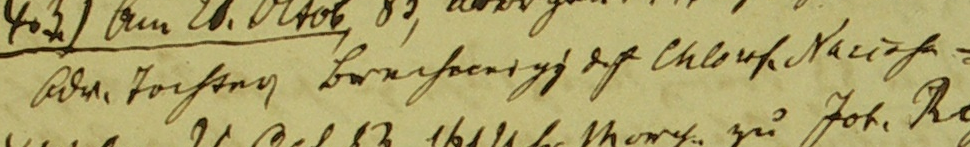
Adv. Tochter, Brechen durch Chloroph. Narcose.
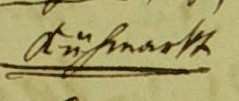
Kühmark
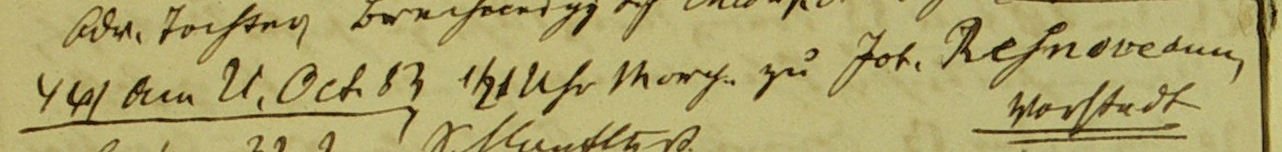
44. Am 21. Okt., 83, ½ 1 Uhr Morg., zu Joh. Rehnovedum,
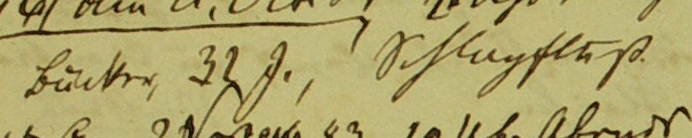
Bäckerr, 32 J. Schlagfluß.
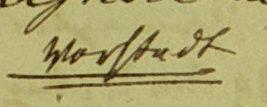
Vorstadt
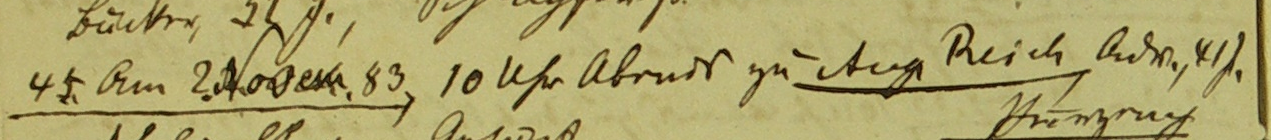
45. Am 2. Nov. 83, 10 Uhr Abends, zu Aug. Reich , Adv., 41. J.
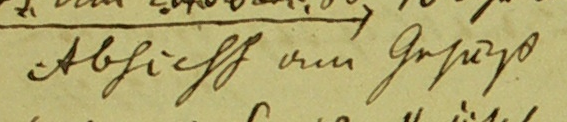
Abscess am Gesäß
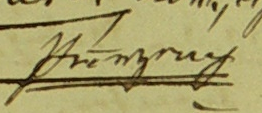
Purzeng.
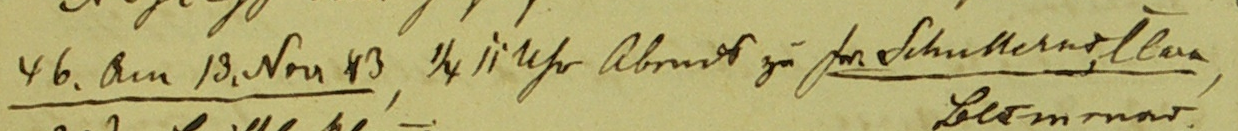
46. Am 13. Nov. 83, ¼ 11 Uhr Abends, zu Fr. Schutterer Clara
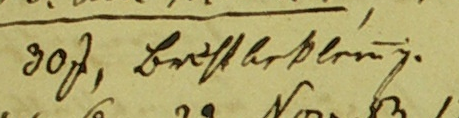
30 J. Brustbeklemmung
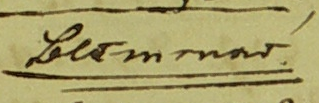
Blumenau
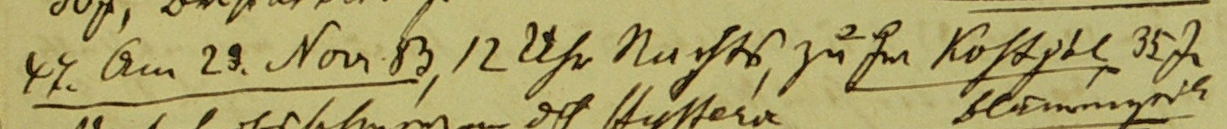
47. Am 23 Nov. 83, 12 Uhr Nachts, zu Fr. Kostybl 35 J.
